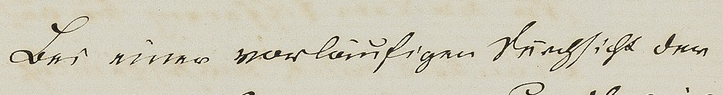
Bei einer vorläufigen Durchsicht der
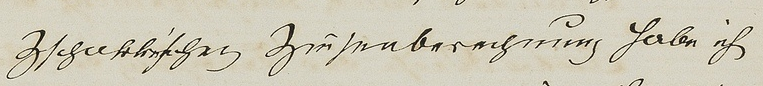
Zschokke'schen Zwischenberechnung habe ich
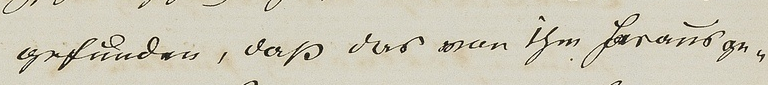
gefunden, daß das von ihm herausge-
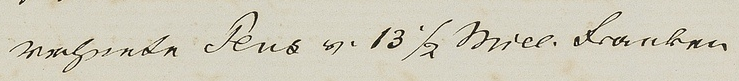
rechnete Plus von 13½ Mill. Franken
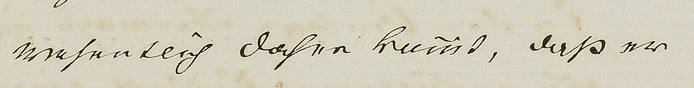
wesentlich daher kommt, daß er
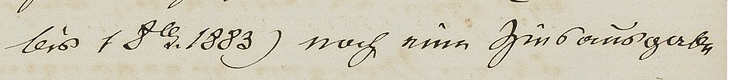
bis 1. 8br 1883) noch eine Zinsausgabe
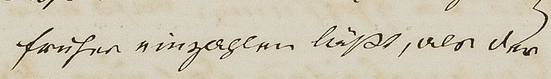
früher einzahlen läßt, als der
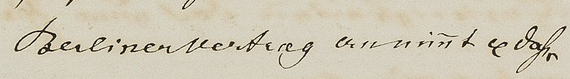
Berlinervertrag annimmt & daher
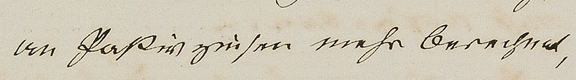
an Paßivzinsen mehr berechnet,
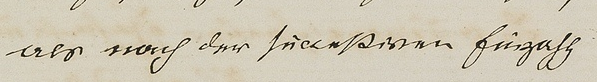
als nach der succeßiven Einzahlg
